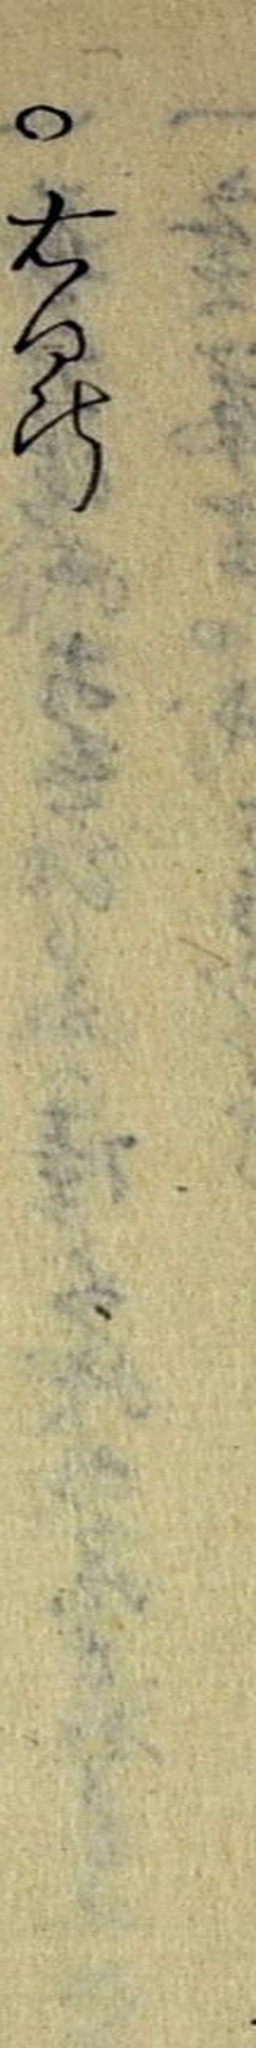○右同断
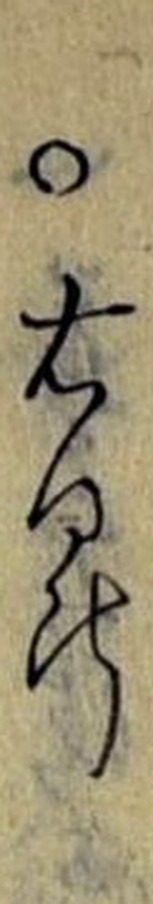○右同断
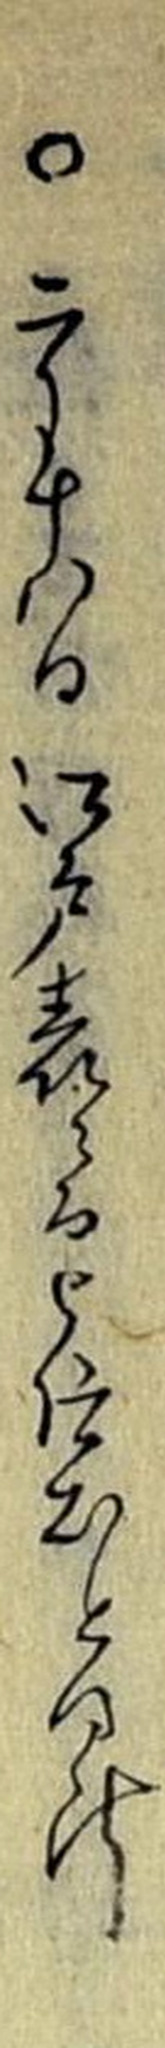○二月十八日江戸表に而被仰出と同断
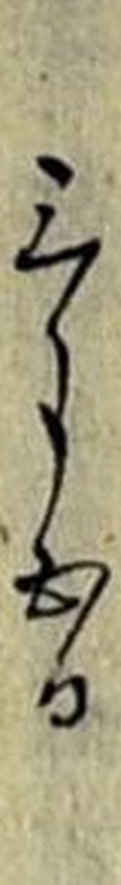三月五日
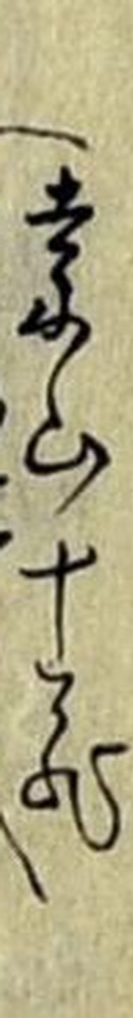桑山十蔵
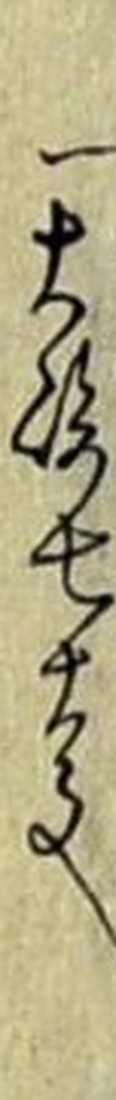大崎七太夫
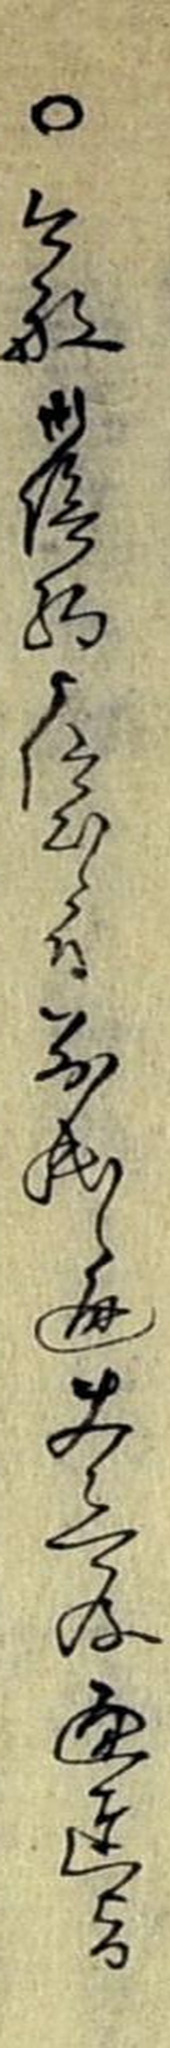○今般御倹約被仰出候候に付別紙之通夫々可及通達旨
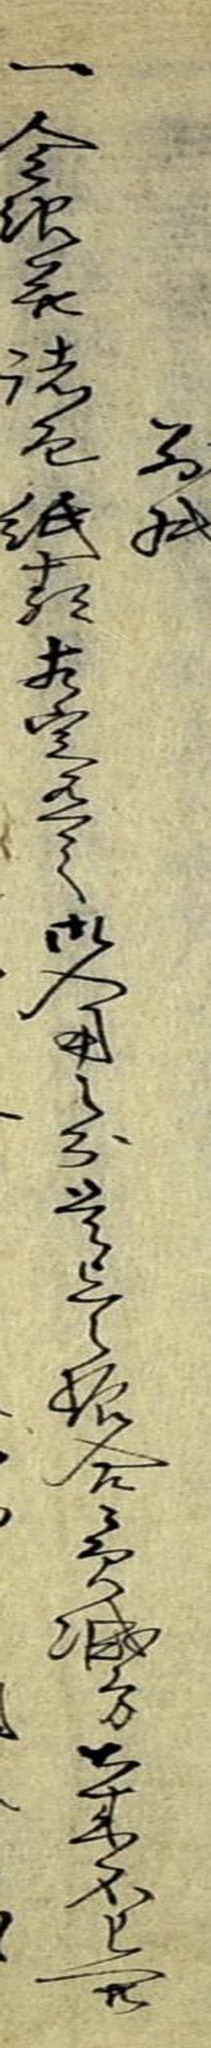一金銀井諸色紙類相定有之御入用之分是迄之振合に而は減方出来不申候へ共
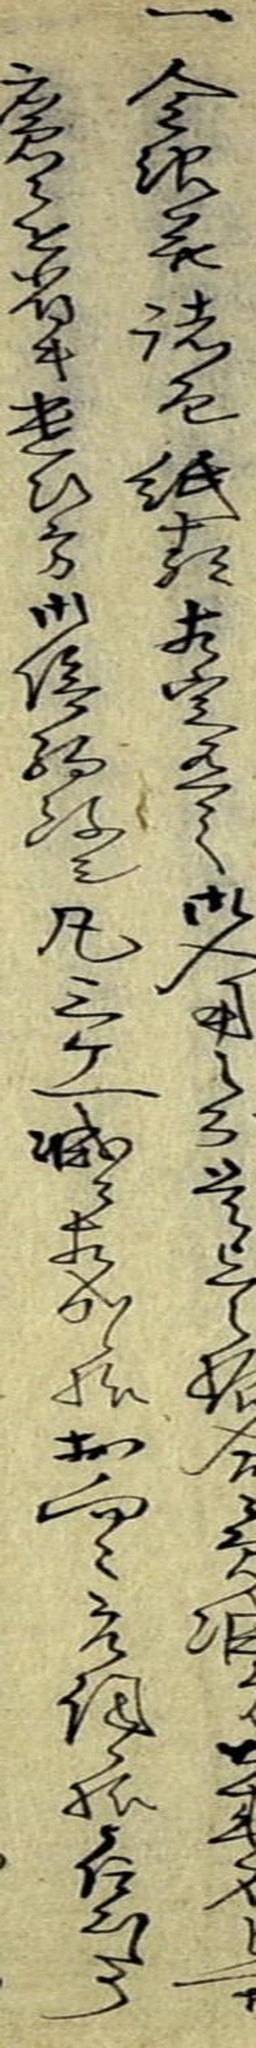廉々を省キ遣ひ方御倹約致し凡三ヶ一減に相成候様於向々取調候様被仰出候事
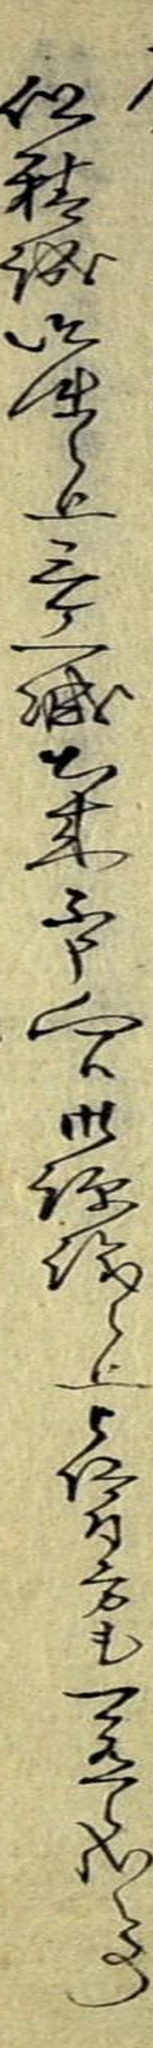但精誠吟味之上三ヶ一減出来不申候へは御評議之上被仰付方も可有之候哉之事
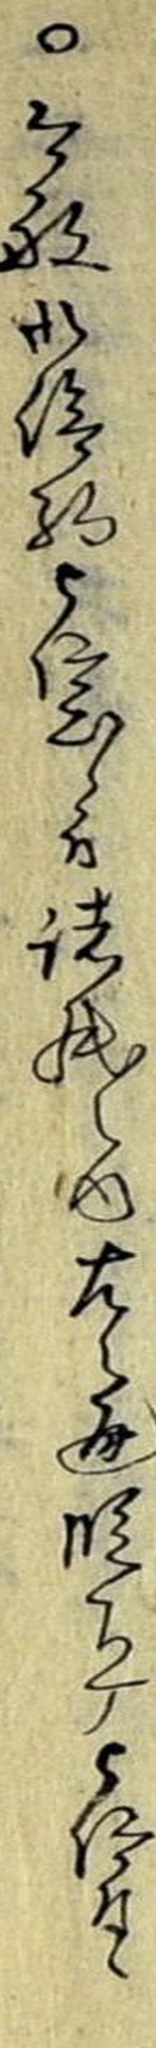○今般御倹約被仰出候に付諸紙之内左之通段下ヶ被仰付候
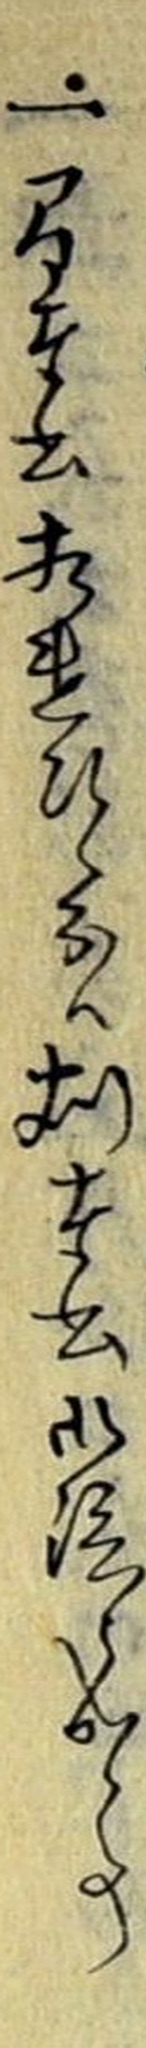一間奉書相遣ひ候分は判奉書御渡被成候事

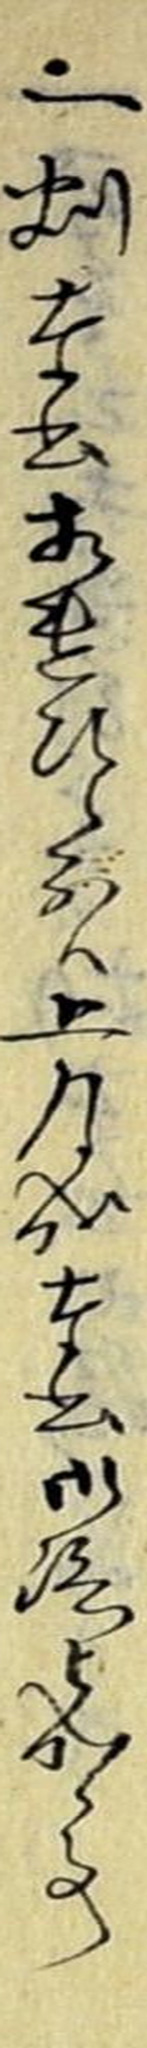一判奉書相遣ひ候分は上月成奉書御渡被成事事
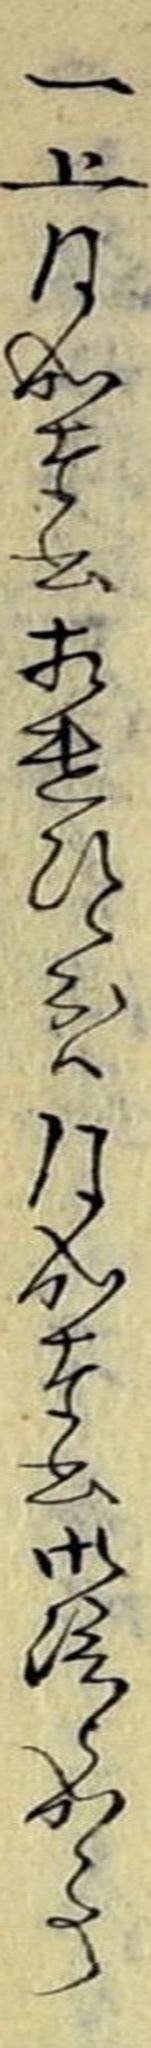一上月成奉書相遣ひ候分は月成奉書御渡被成候事
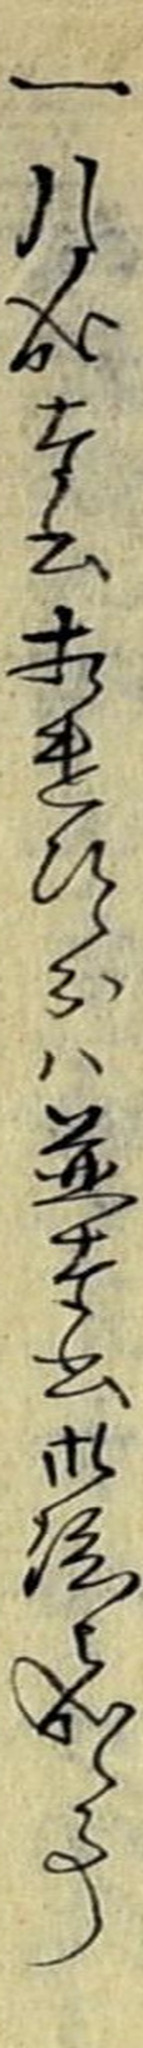一月成奉書相遣ひ候分は並奉書御渡被成候事
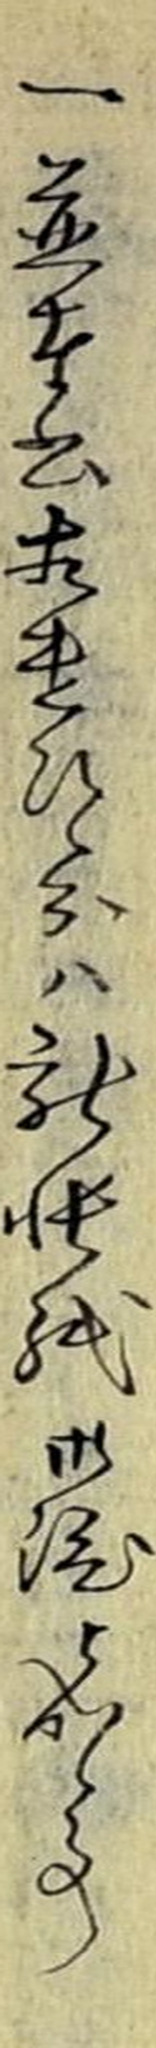一並奉書相遣被候分は新帳紙御渡被成候事
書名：命令之部 四
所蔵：福井県文書館 Fukui Prefectural Archives
